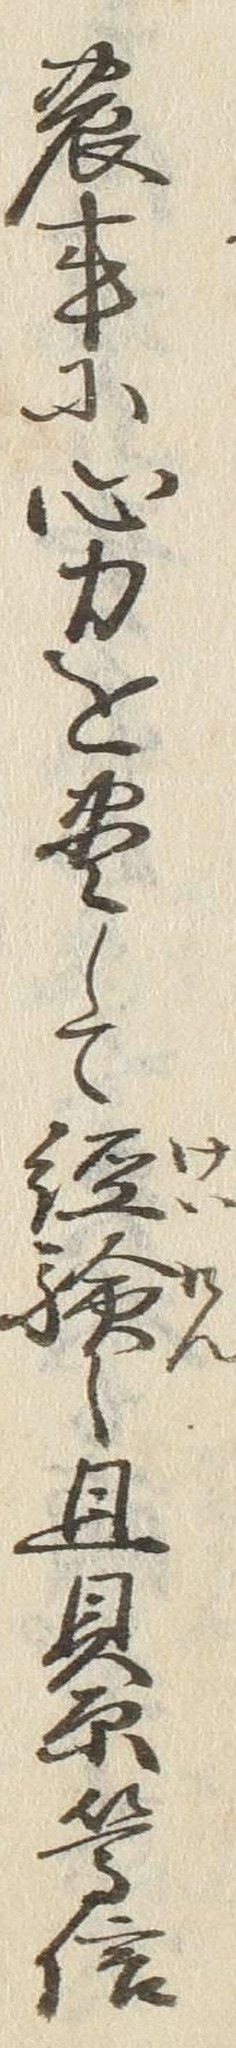農事尓心力を尽して経験し且貝原等信
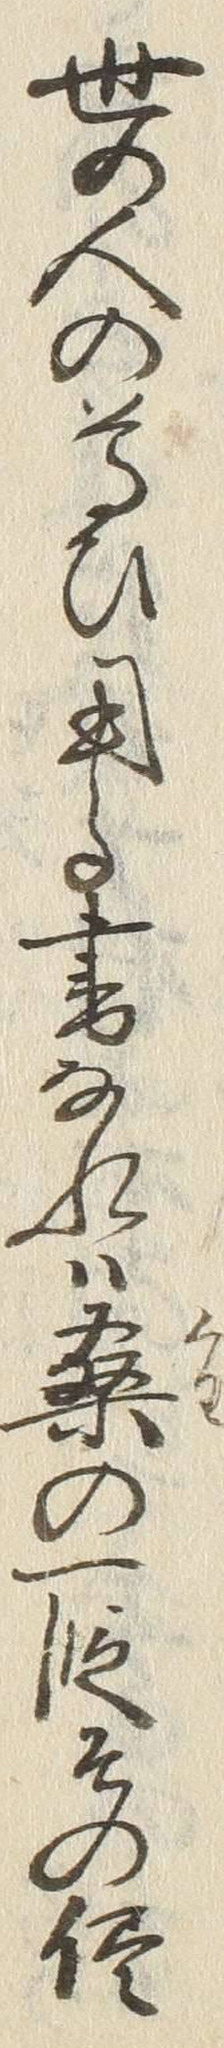世の人の尊ひ用る書なれは桑の一段その侭
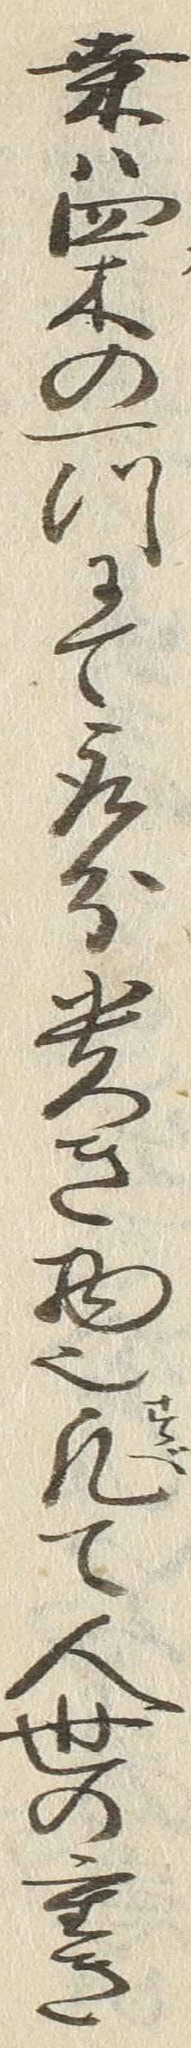桑は四木の一川尓て取分貴き物也凡て人世の重き
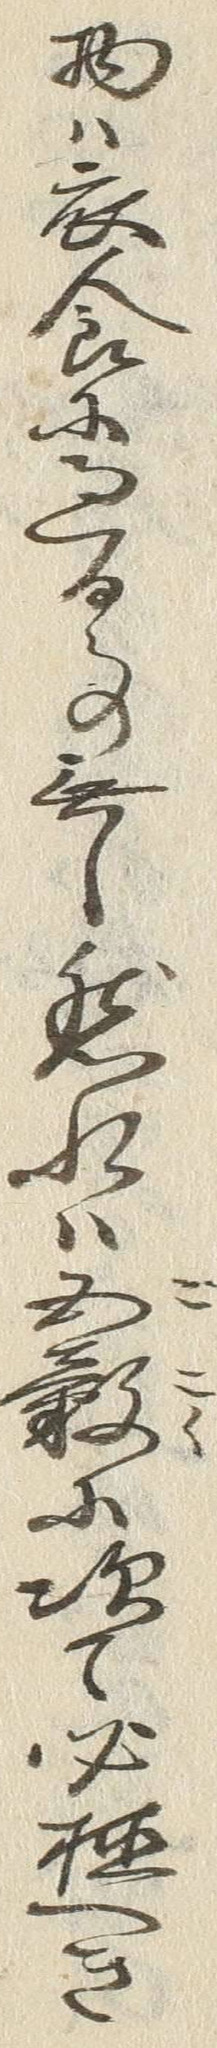物は衣食尓過る事無し然れは五穀尓次て必植へき
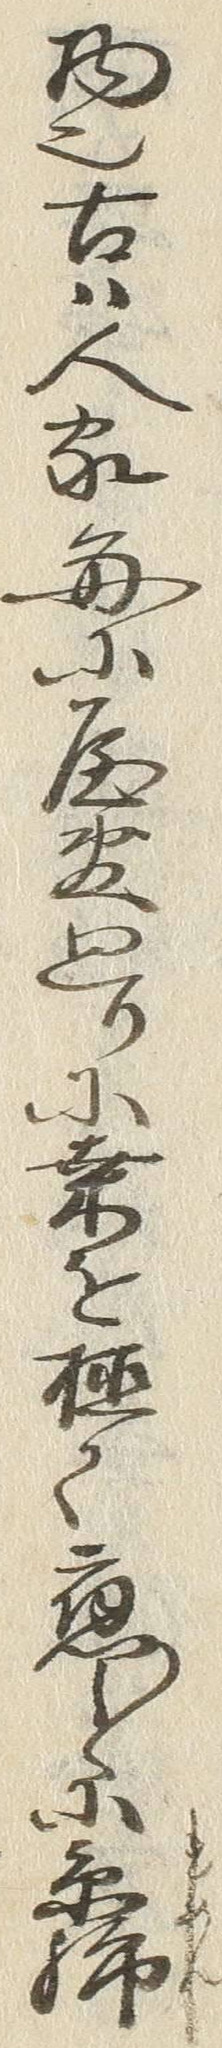物也古は人家毎尓屋敷廻り尓桑を植て應し〳〵尓糸綿
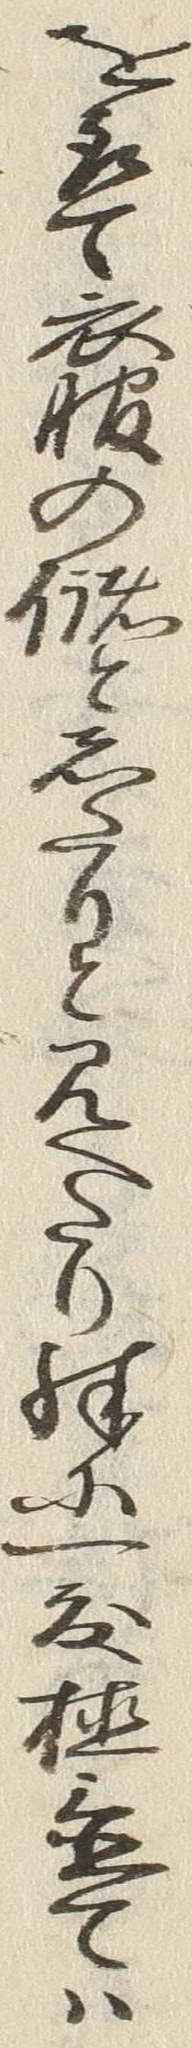を取て衣服の儲と志たりと見へたり殊尓一度植置ては
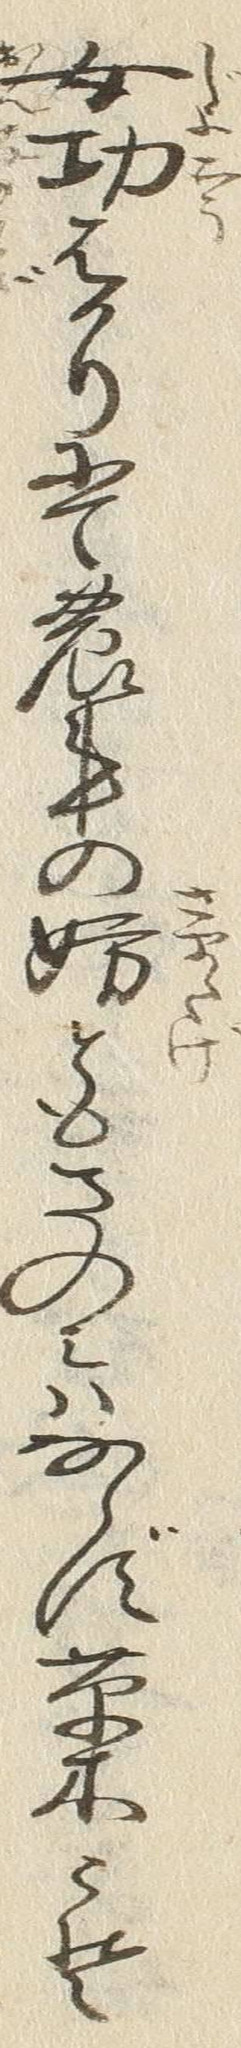女功はかり尓て農事の妨ともさのみはならず草木ら登
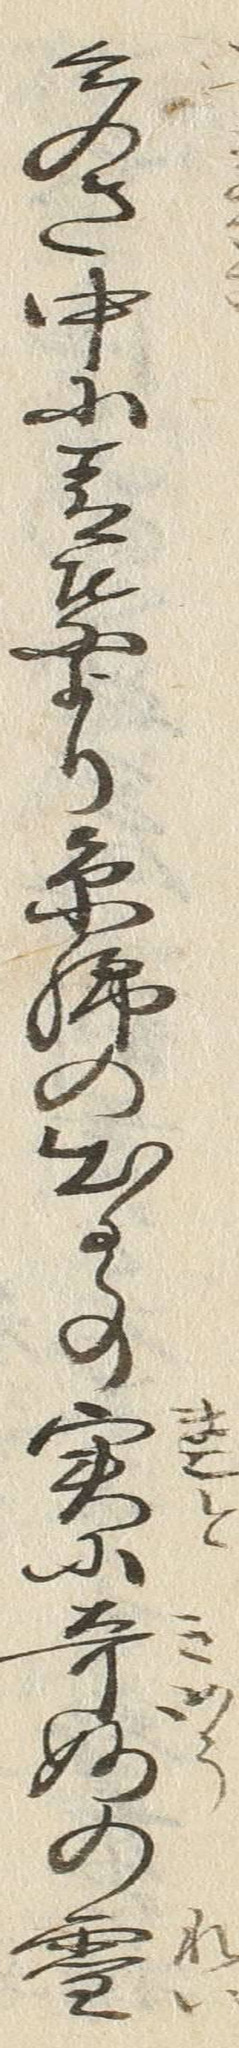多き中尓青葉より糸綿の出る事実尓奇妙の霊
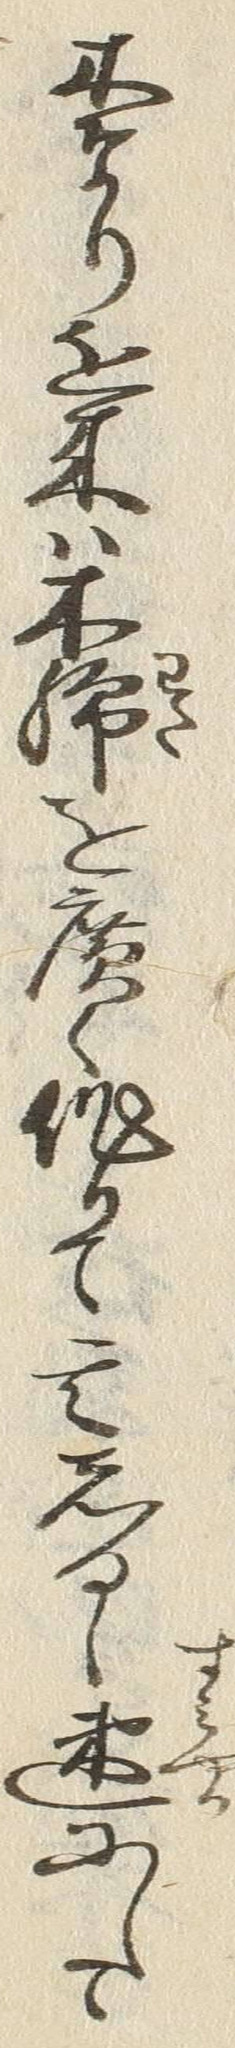木なり近来は木綿を廣く作りて其志るし速尓して
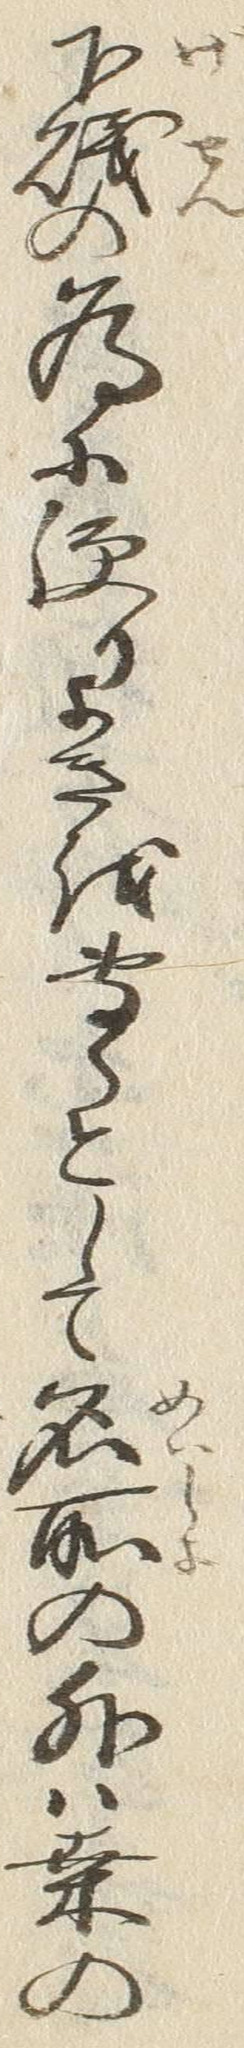下賤の為尓便りよき越専らとして名所の外は桑の
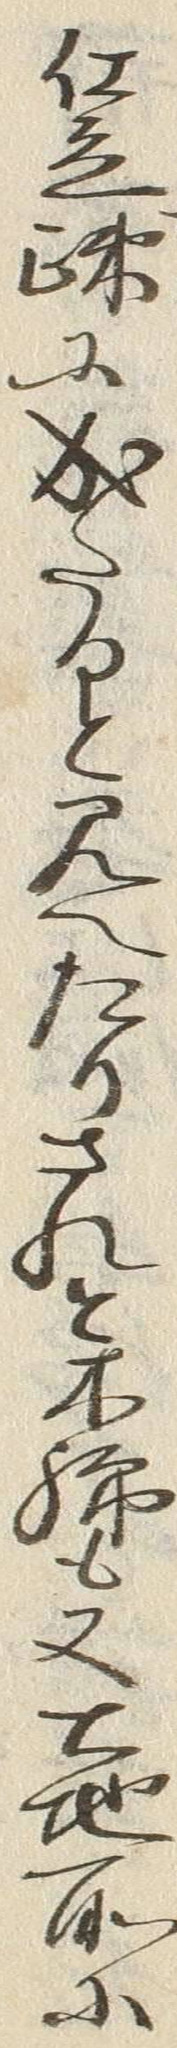仕立疎尓成たると見へたりされと木綿も又土地所尓
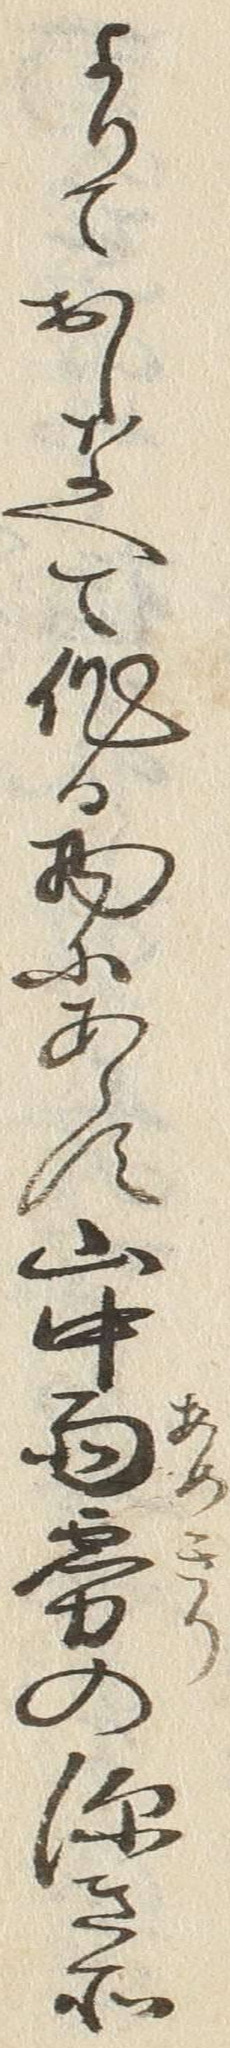よりておしなへて作る物尓あら須山中雨霧の深き所
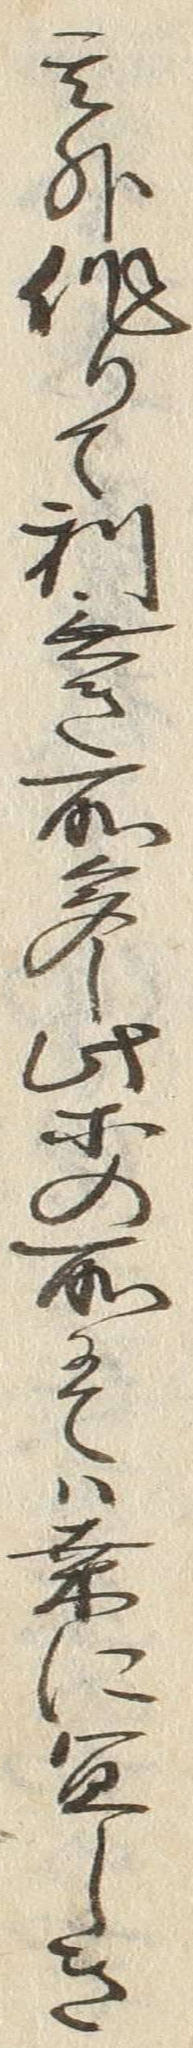其外作りて利無き所多し此等の所尓ては桑に宜しき
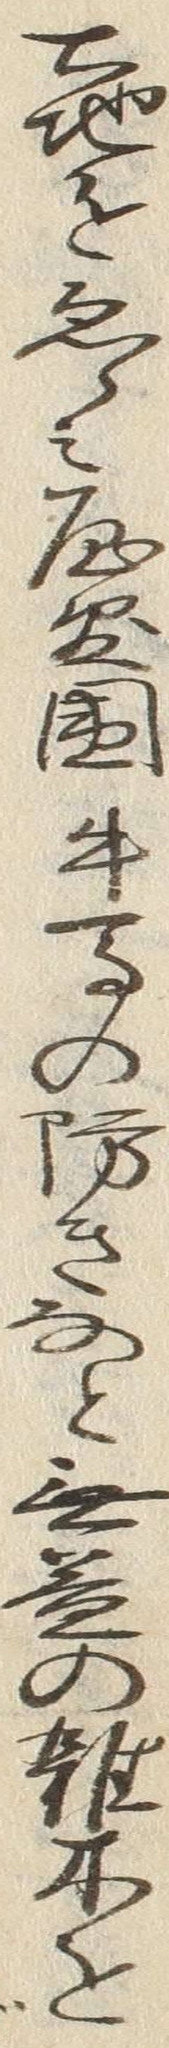土地をゑらみ屋敷囲牛馬の防きなと無益の雑木を
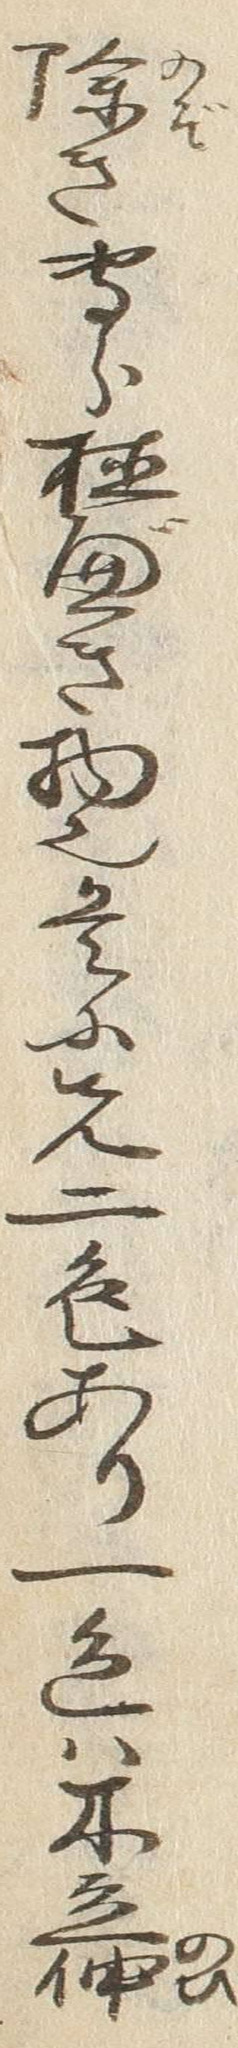除き専ら植べき物也是尓先二色あり一色は木立伸

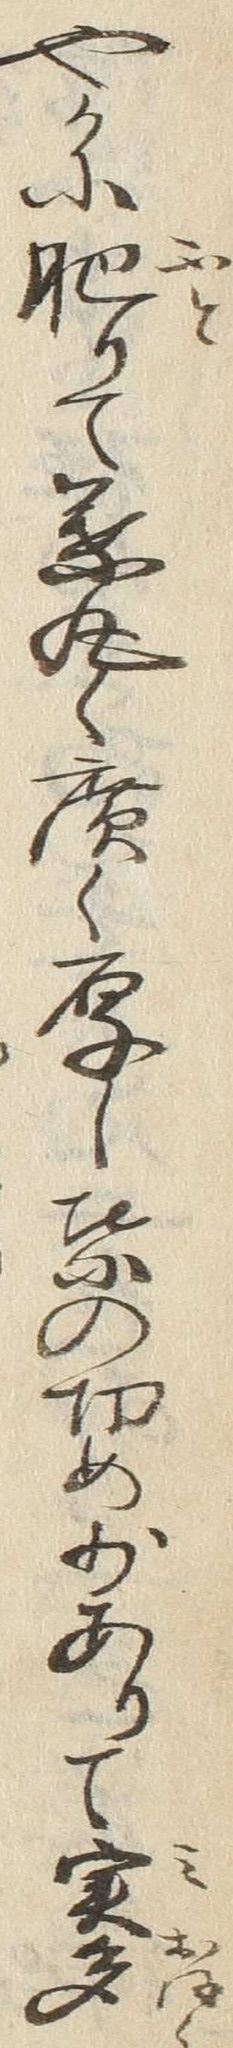やか尓肥りて葉丸く廣く厚し葉の切め少ありて実多
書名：養蠶實驗録後編
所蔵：東京大学農学生命科学図書館 国文学研究資料館
